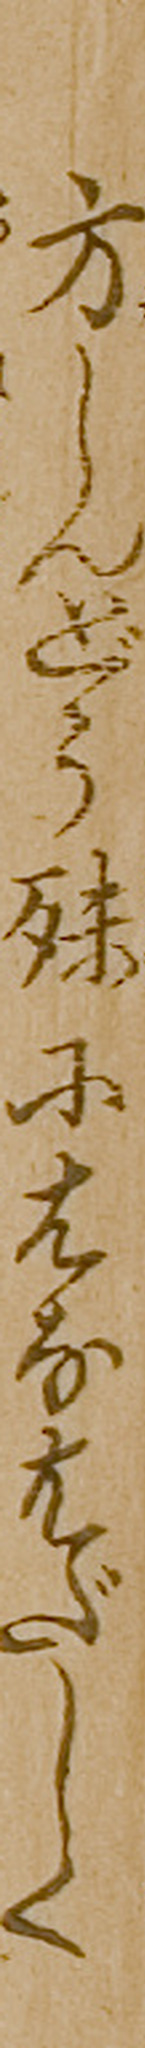方しんどう殊にはなはだしく
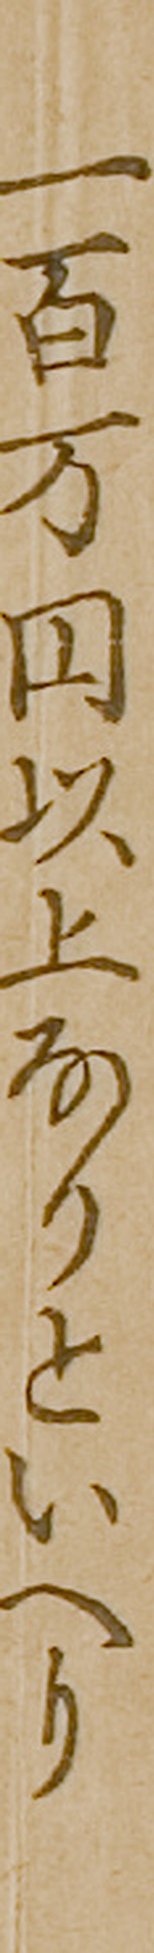一百万円以上なりといへり
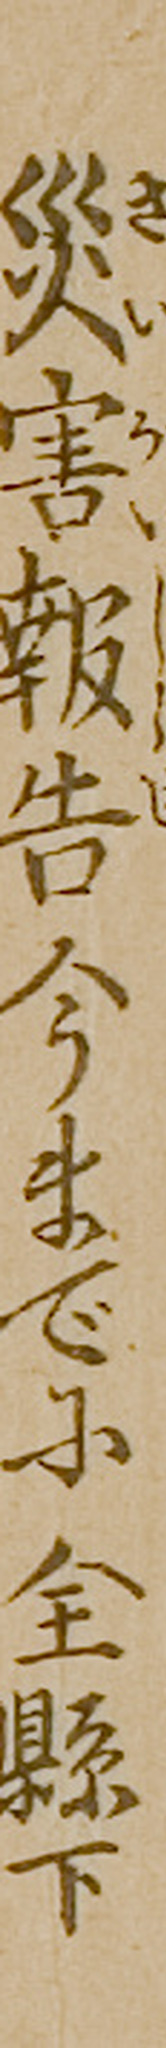災害報告今までに全県下
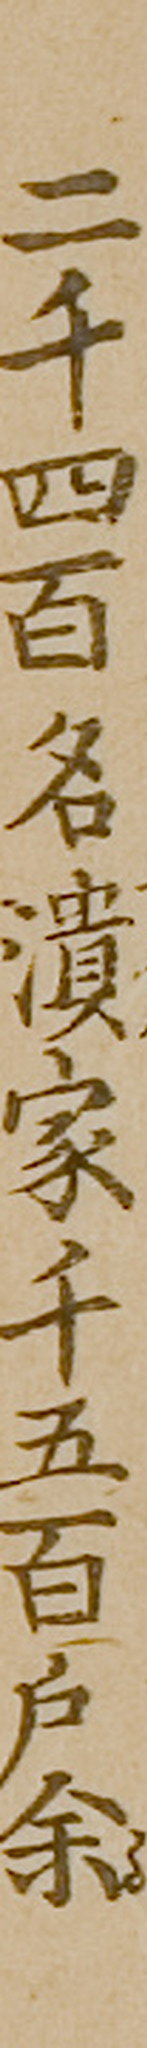二千四百名潰家千五百戸余
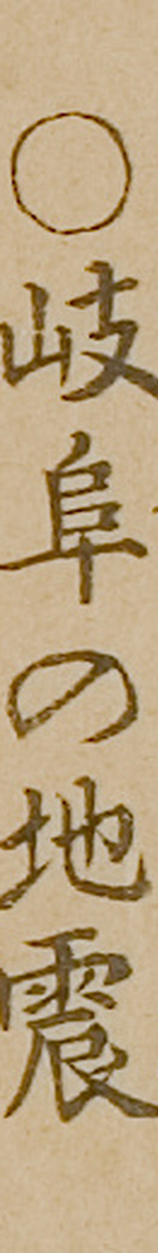◯岐阜の地震
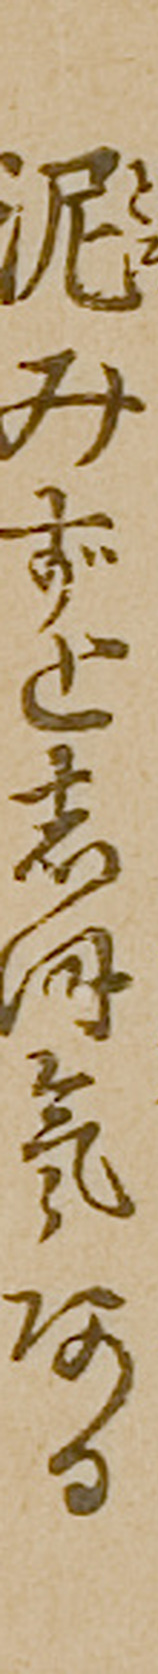泥みずとしほ気ある
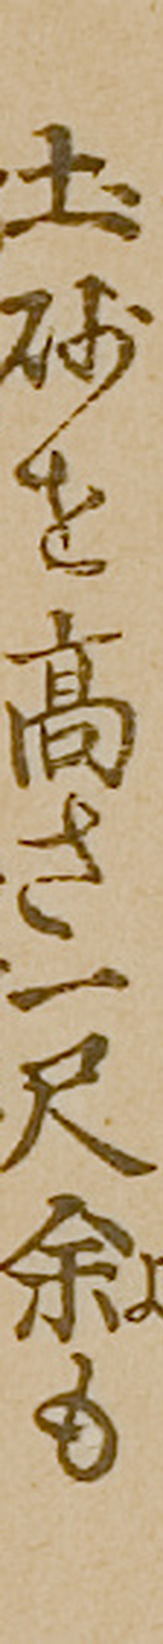土砂を高さ一尺余も
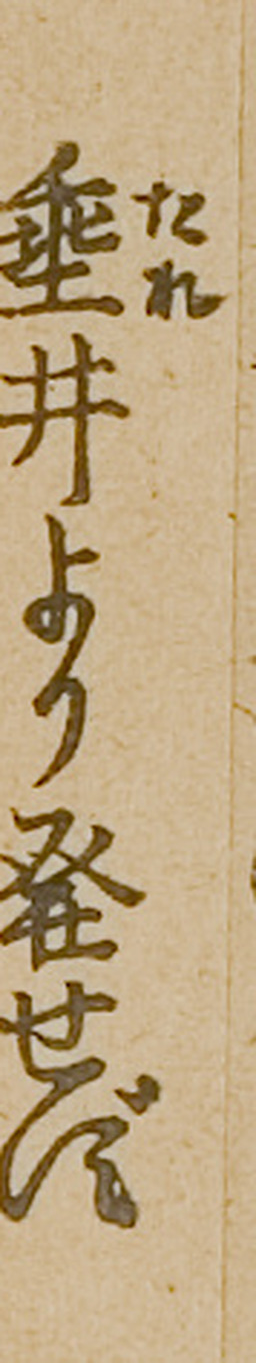垂井より発せず
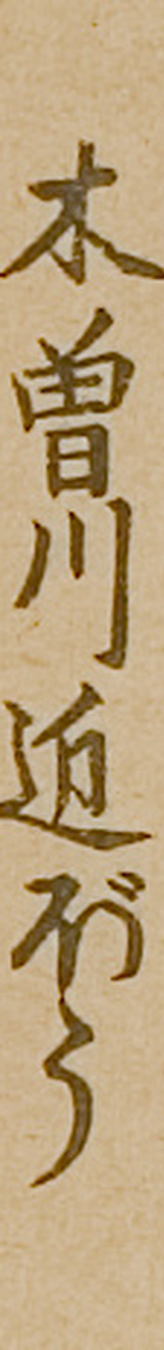木曽川近ぼう
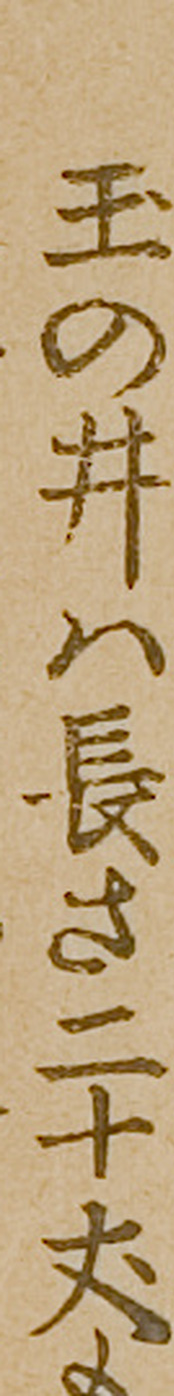玉の井は長さ二十丈も
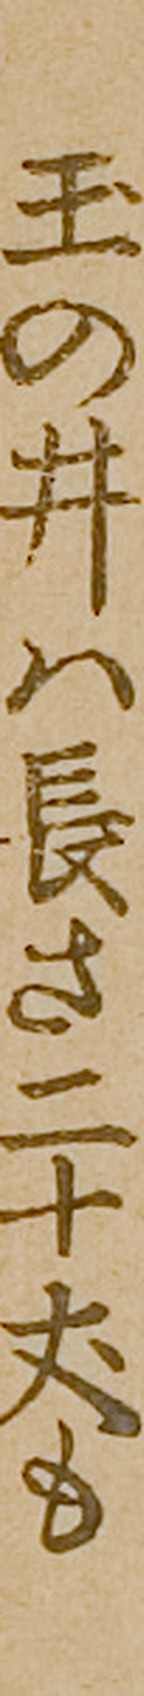玉の井は長さ二十丈も
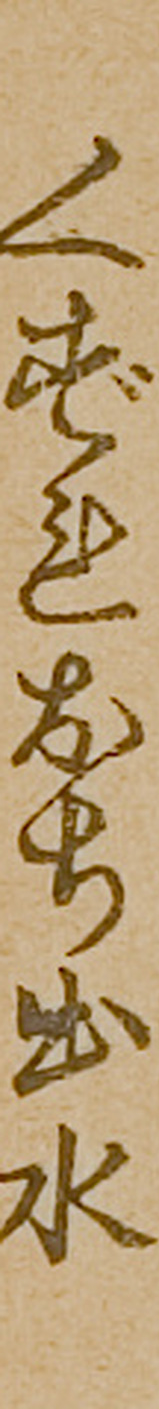くずれおち出水
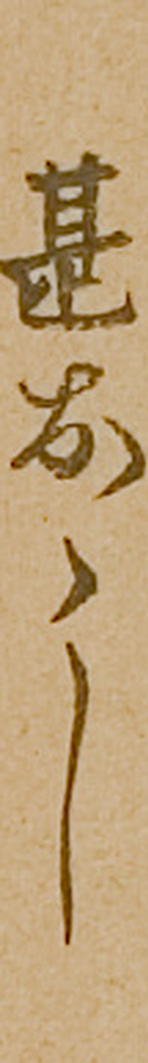甚おゝし
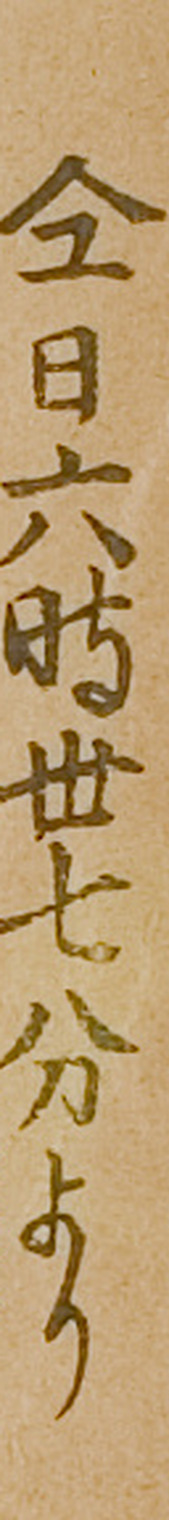仝日六時三十七分より
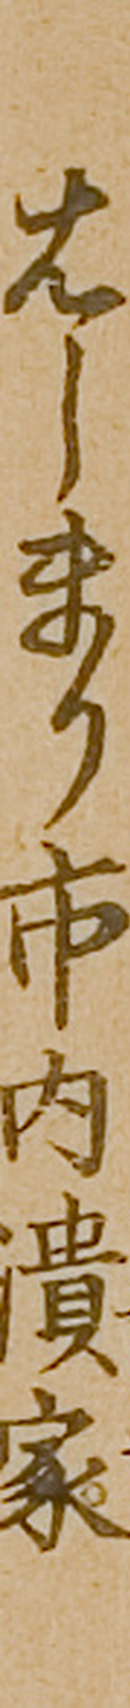はしまり市内潰家
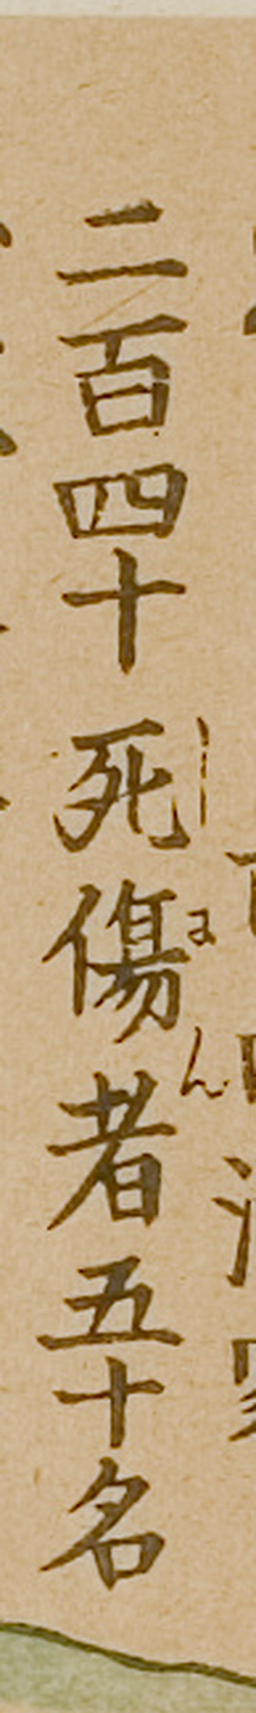二百四十死傷者五十名
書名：愛知岐阜福井三県下大地震之図
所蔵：東京大学総合図書館 General Library in the University of Tokyo, JAPAN
